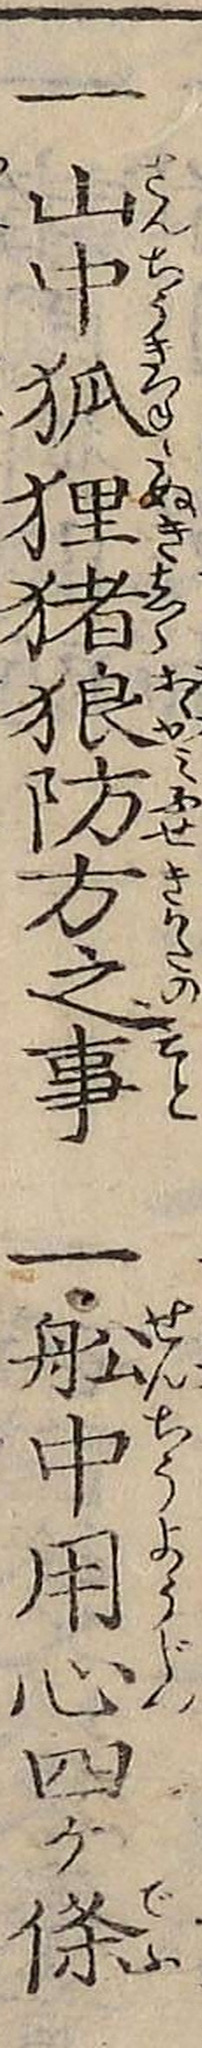一山中狐狸猪狼防方之事一船中用心四ケ条
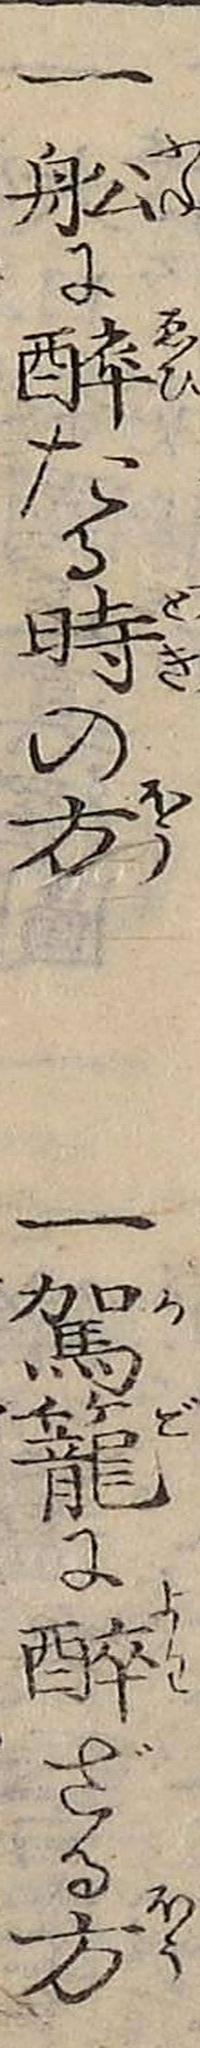一船に酔たる時の方一駕籠に酔ざる方
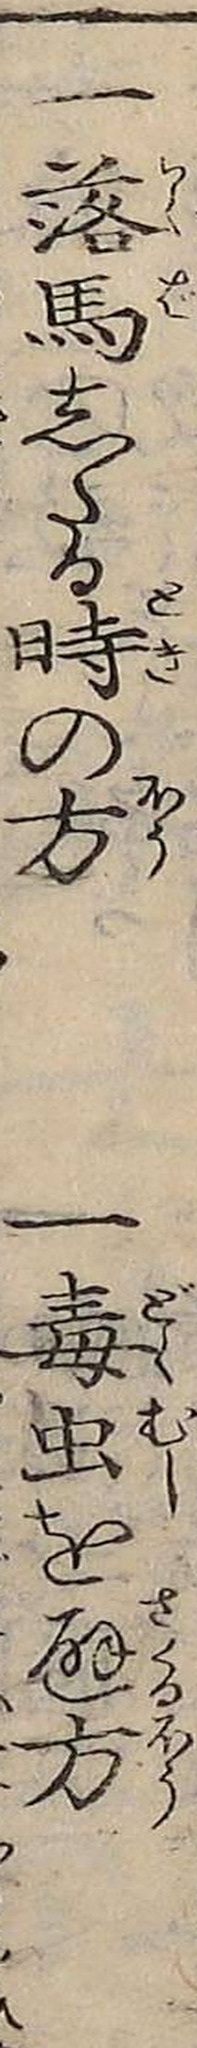一落馬したる時の方一毒虫を避方
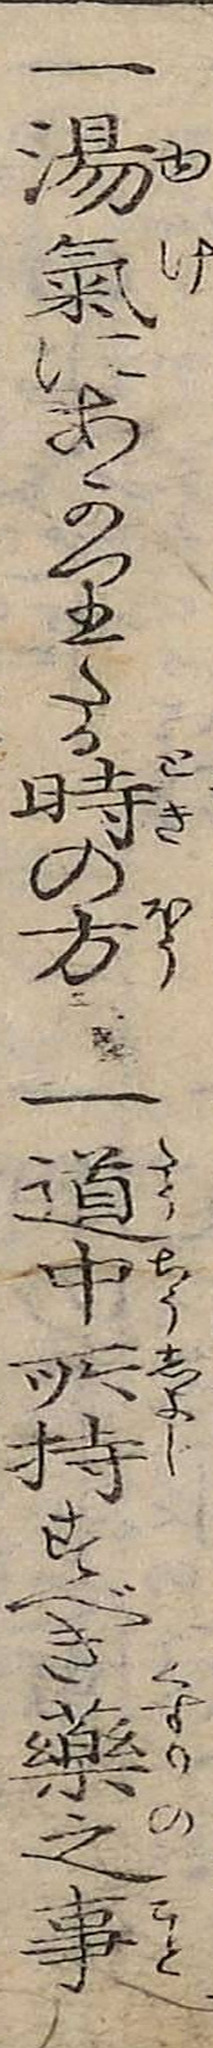一湯気にあかりたる時の方一道中所持すべき薬之事
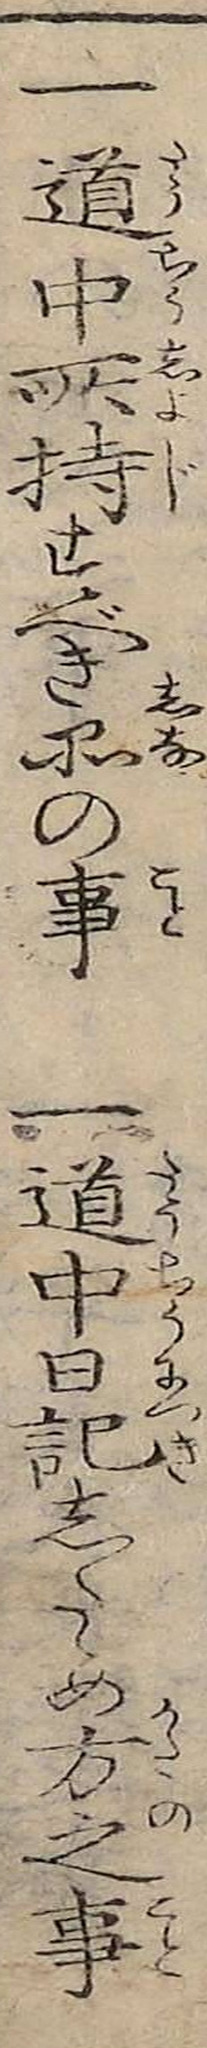一道中所持すべき品の事一道中日記したゝめ方之事

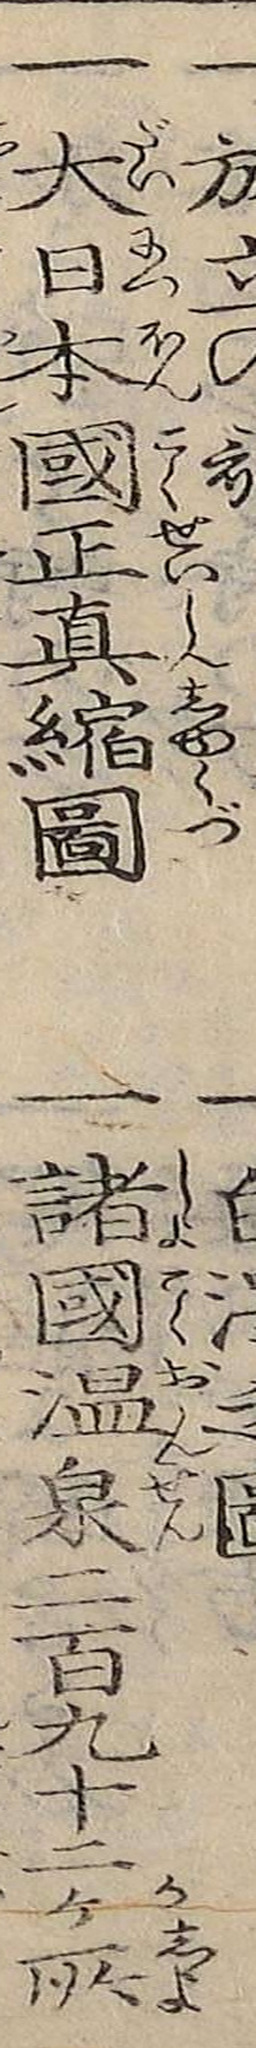一大日本国正真縮図一諸国温泉二百九十二ケ所
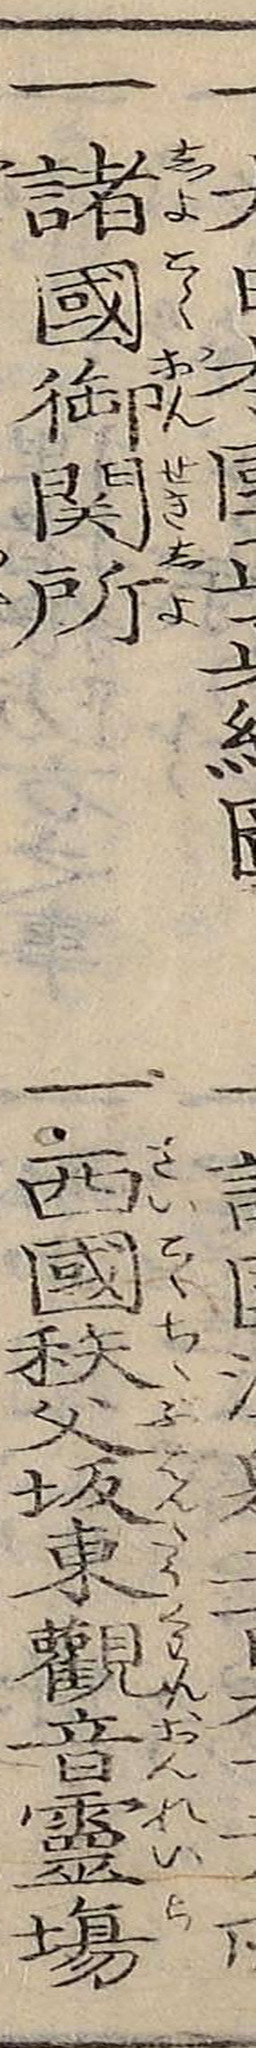一諸国御関所一西国秩父坂東観音霊場
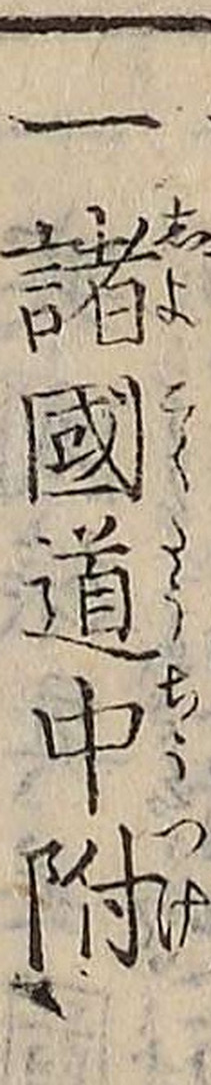一諸国道中附
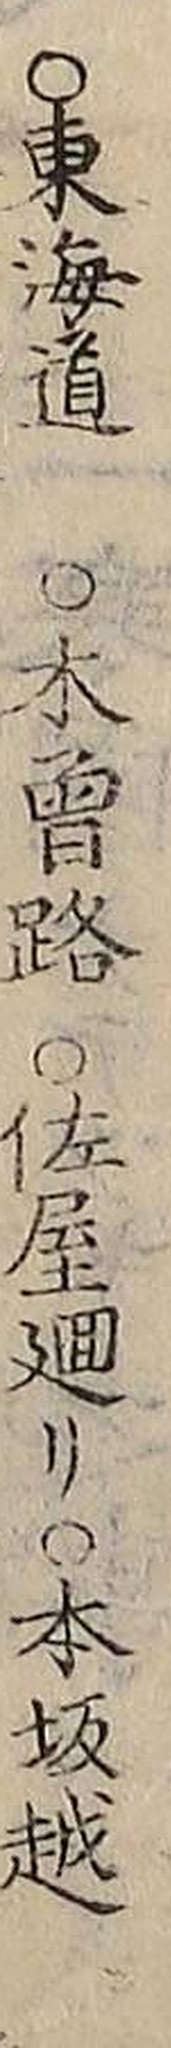○東海道○木曽路○佐屋廻り○本坂越
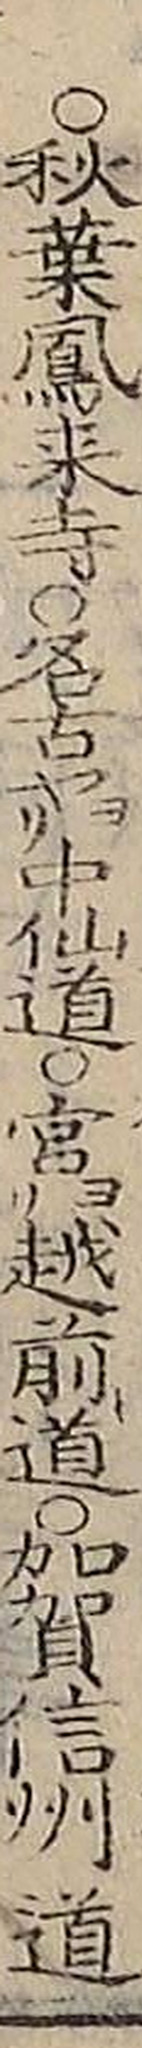○秋葉鳳来寺〇名古やヨリ中仙道○宮ヨリ越前道〇加賀信州道
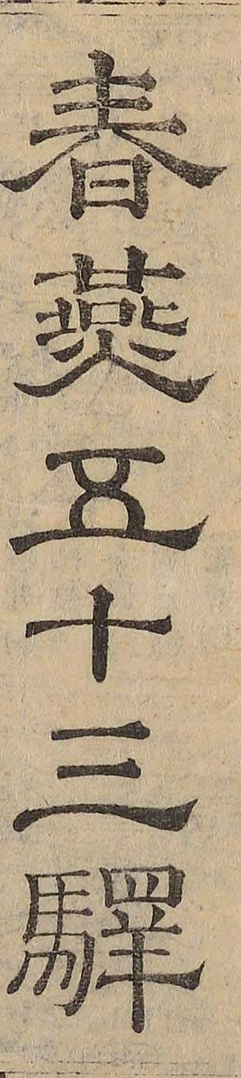春燕五十三駅
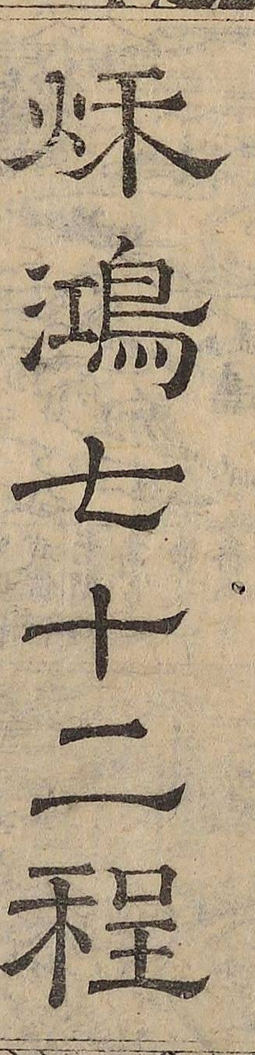秋鴻七十二程

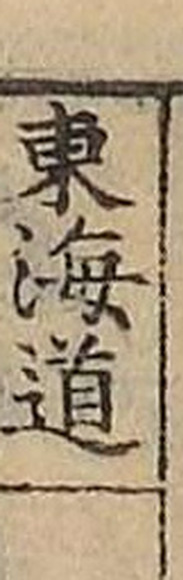東海道
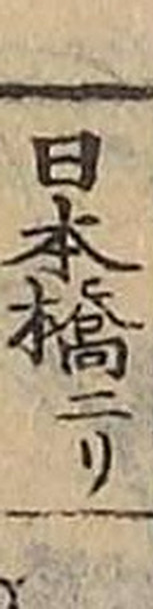日本橋二リ
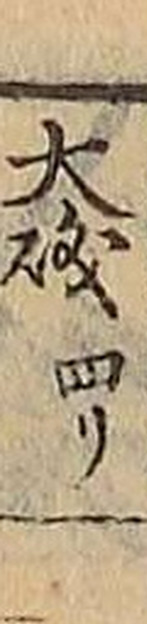大磯四リ
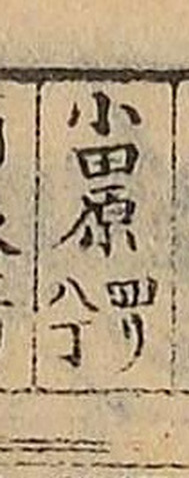小田原四リ八丁
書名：旅行用心集
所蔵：神戸大学附属図書館 国文学研究資料館
